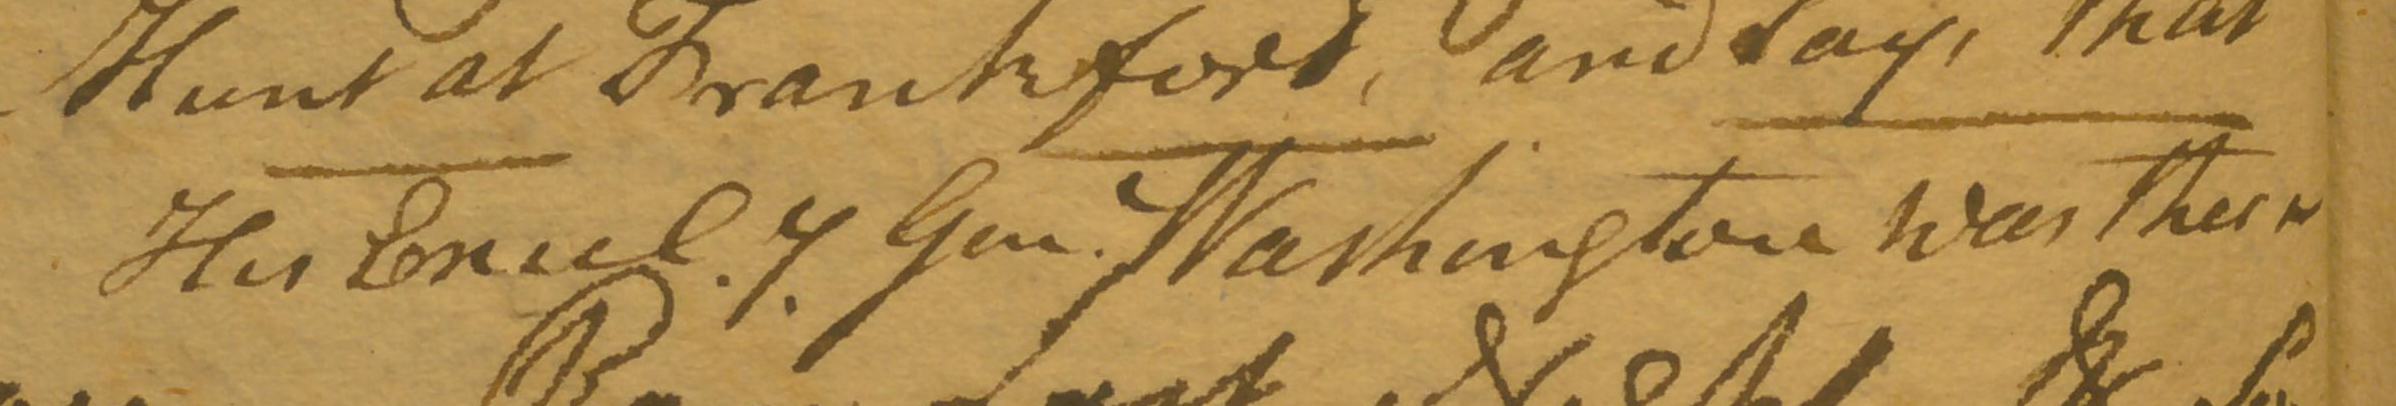His Excel^y. Gen^l. Washington was there
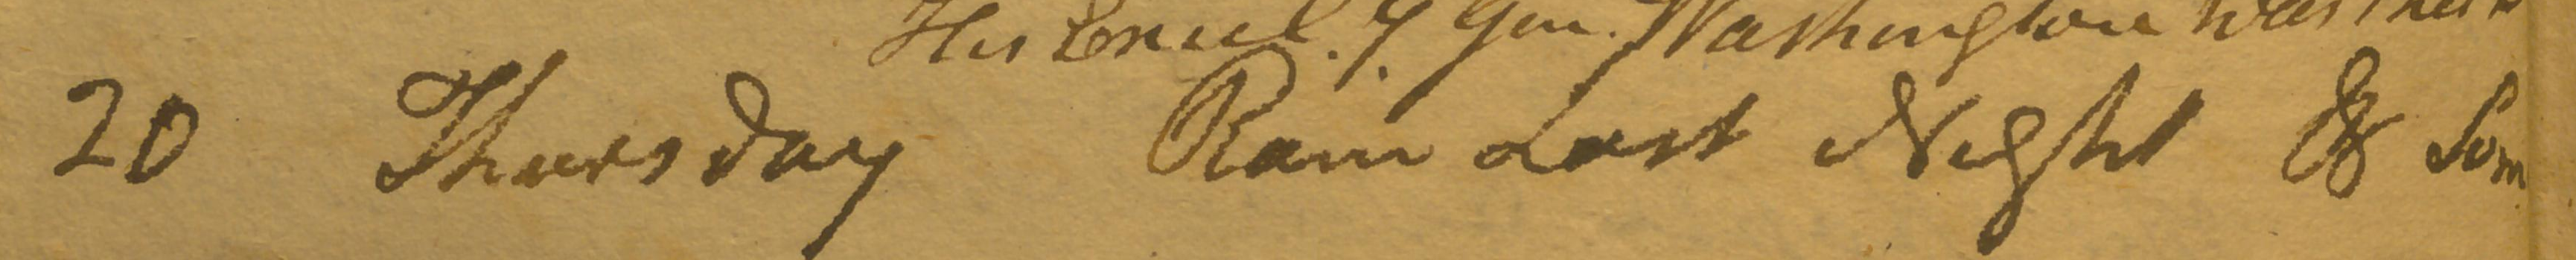20 Thursday Rain Last Night & Som
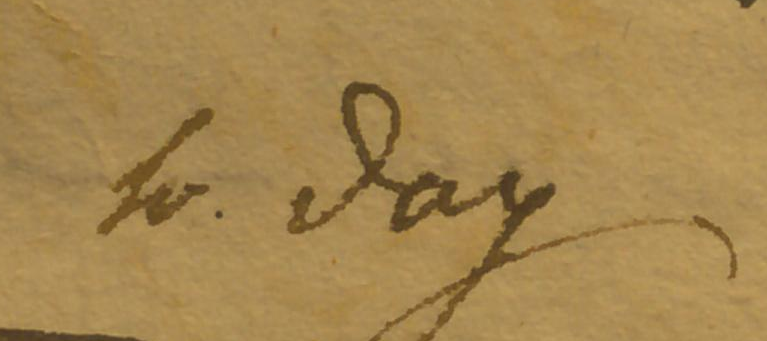to day
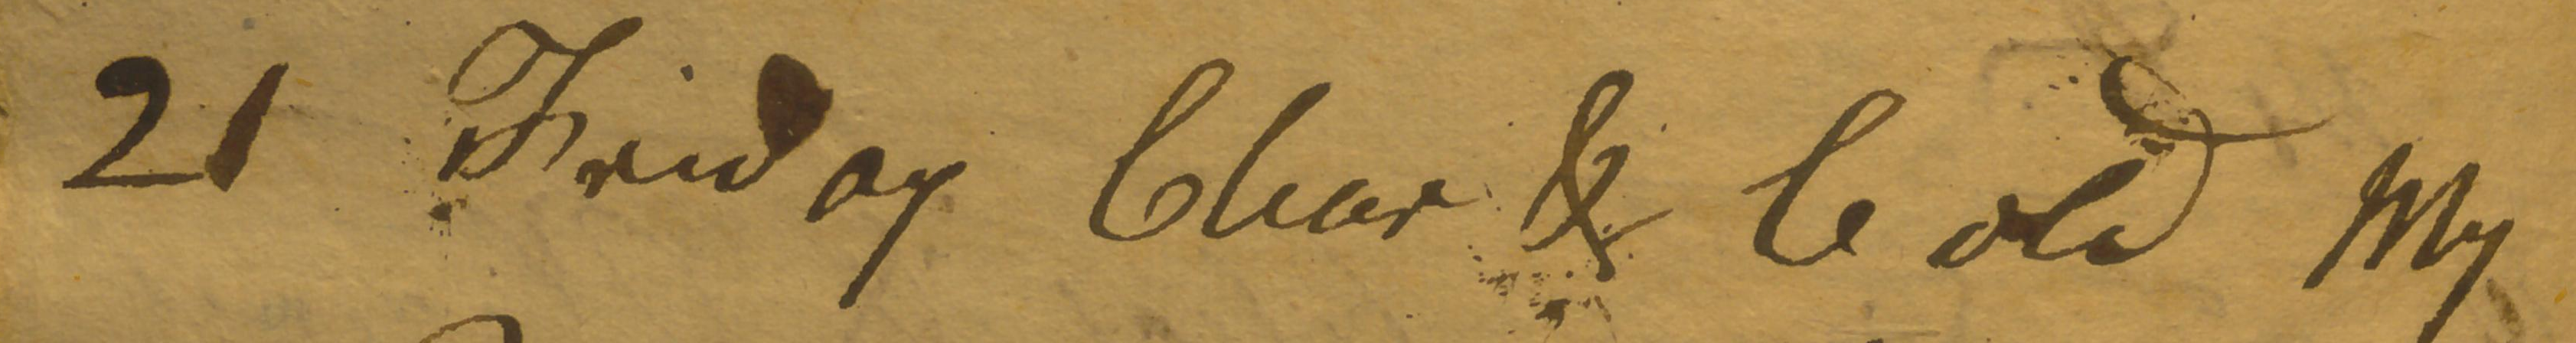21 Friday Clear & Cold My
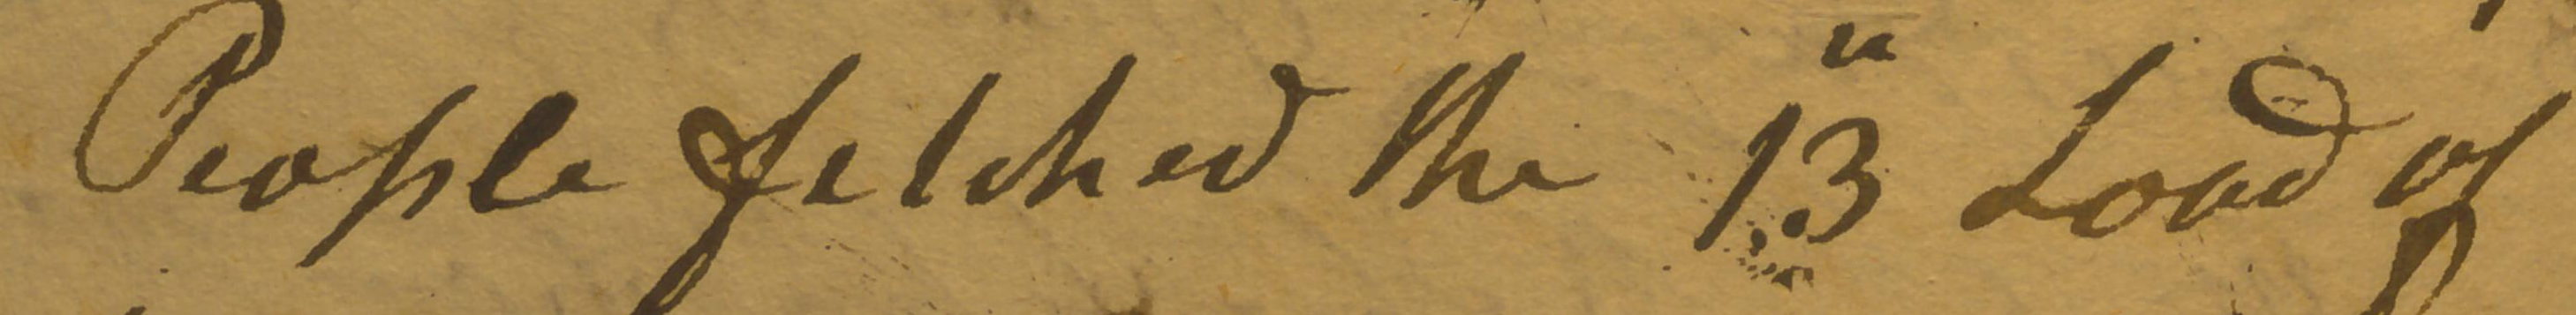People fetched the 13^th Load of
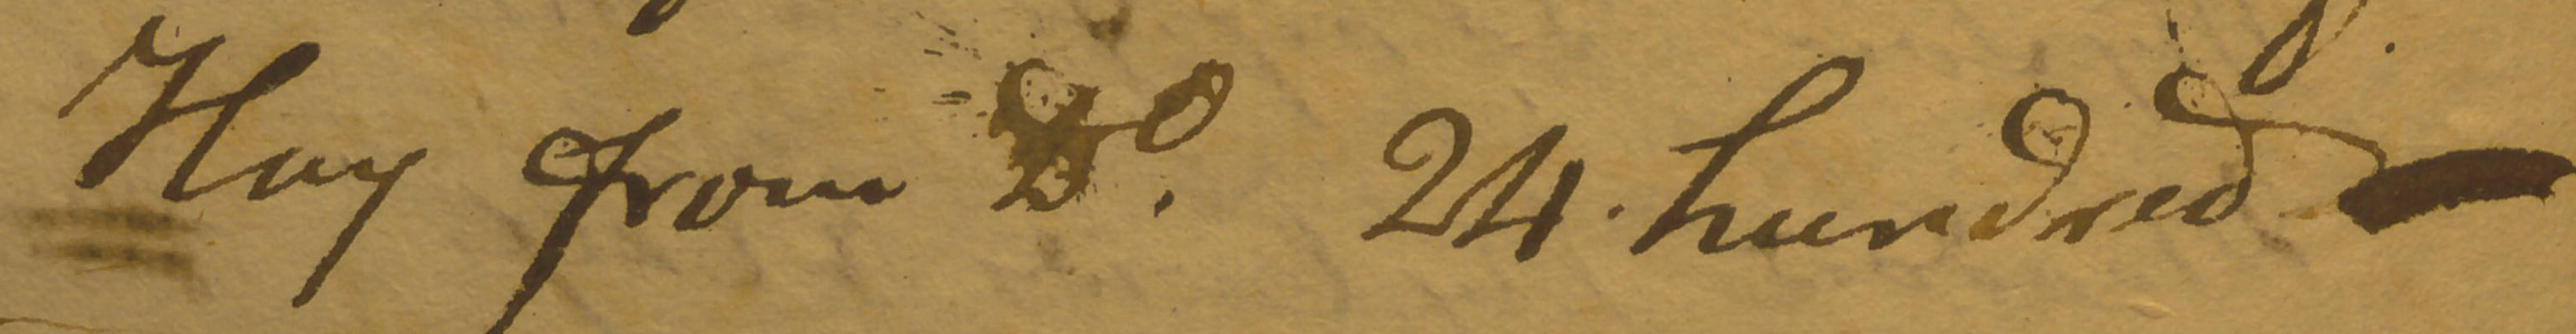Hay from D^o. 24 hundred
